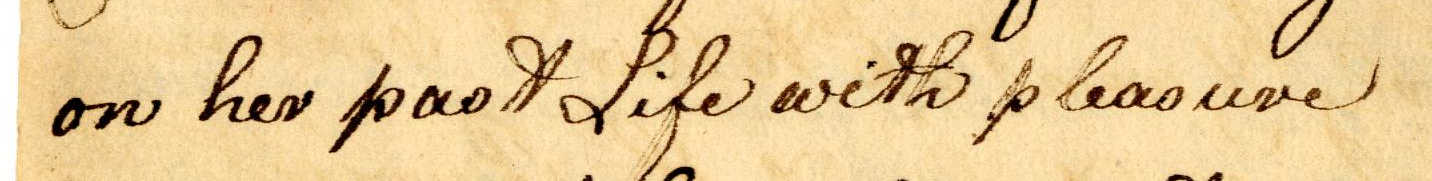on her past Life with pleasure
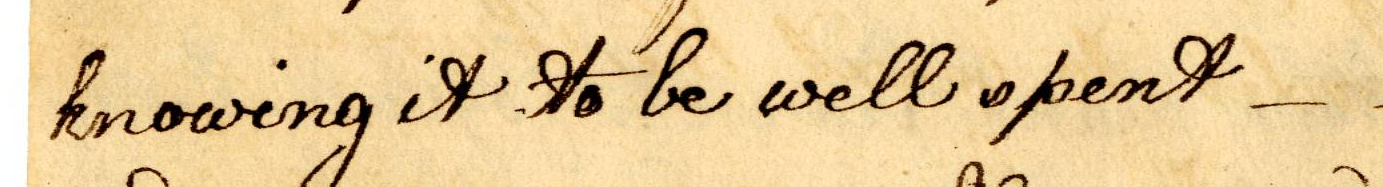knowing it to be well spent-
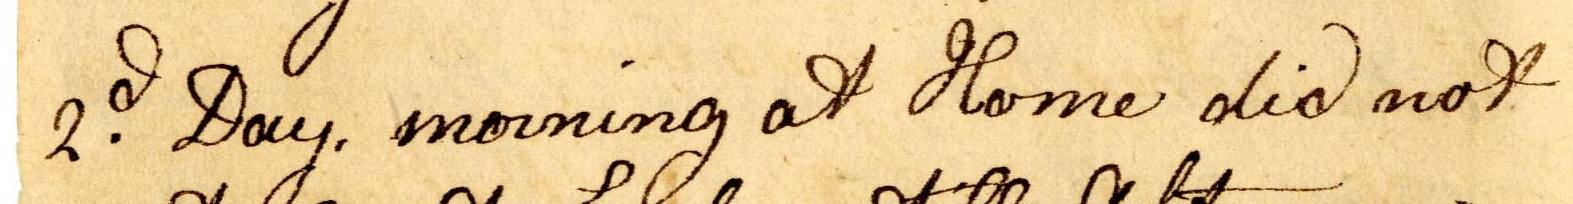2^d. Day. morning at Home did not
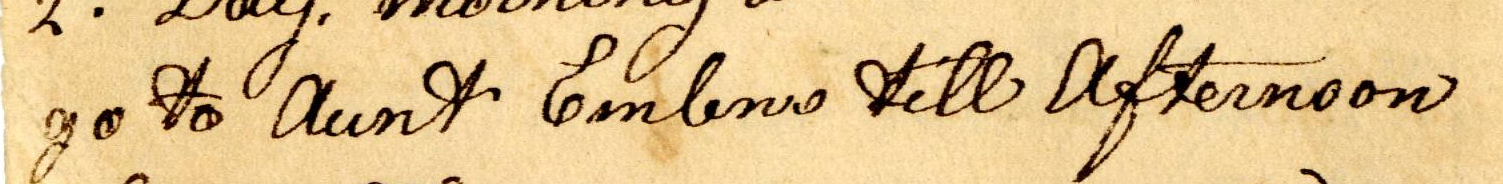go to Aunt Emlens till Afternoon
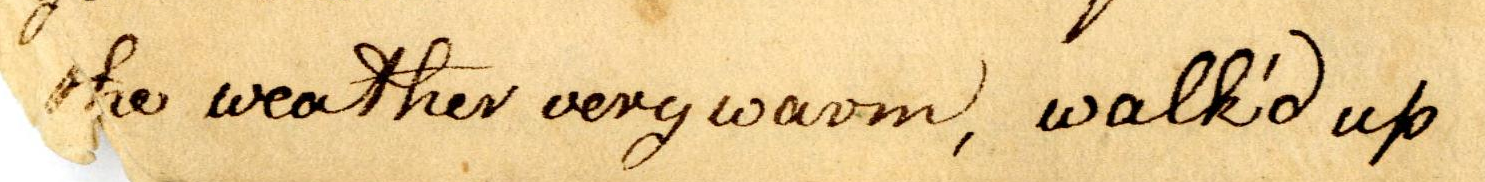the weather very warm, walk'd up
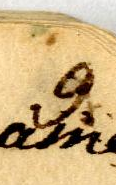9
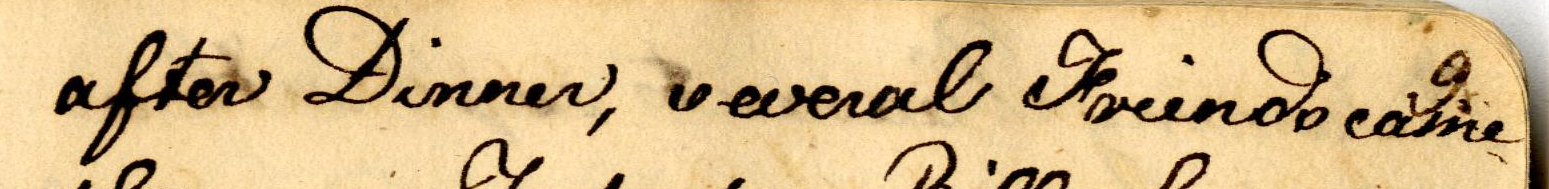after Dinner, several Friends came
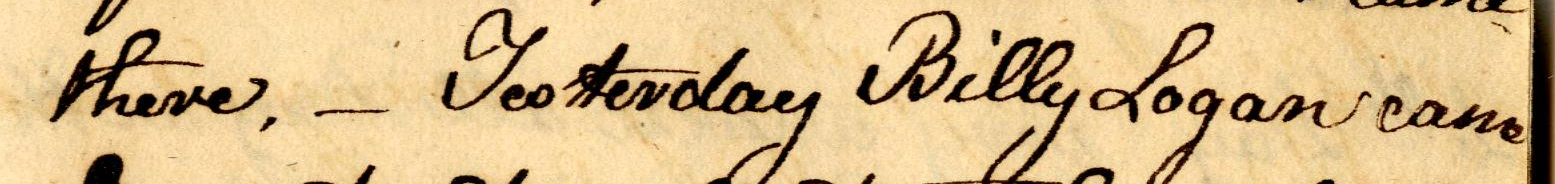there, - Yesterday Billy Logan came
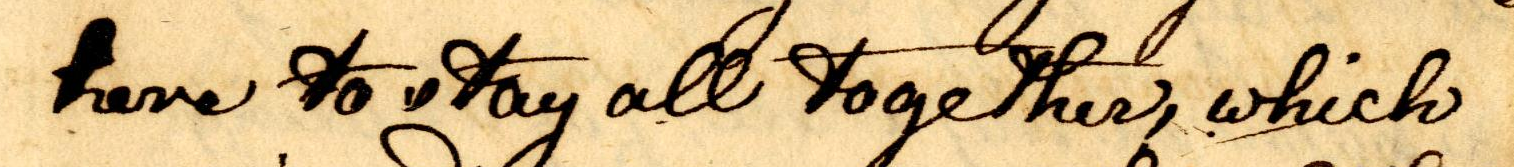here to stay all together, which
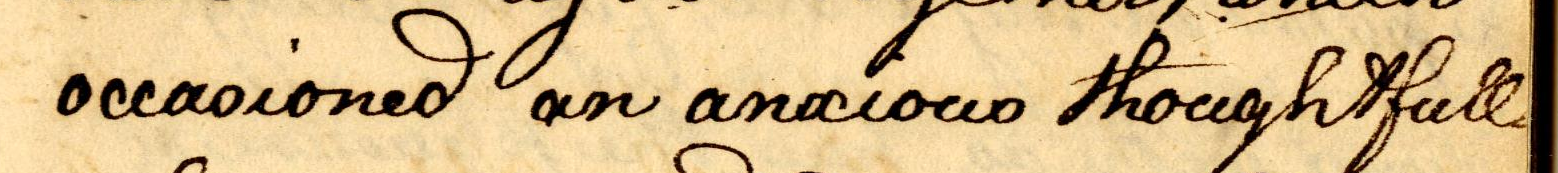occasioned an anxious thoughtfull
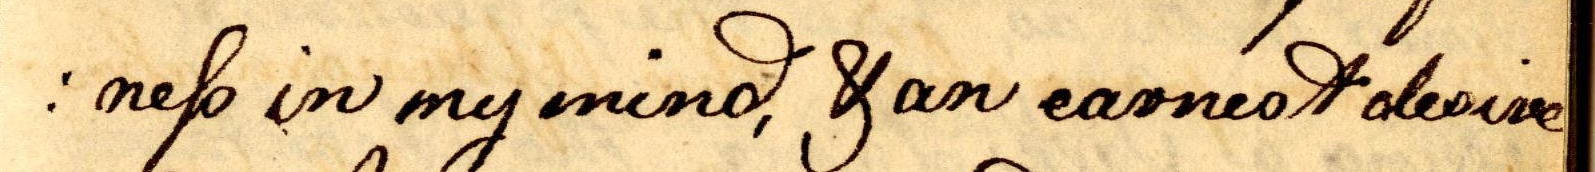-ness in my mind, & an earnest desire
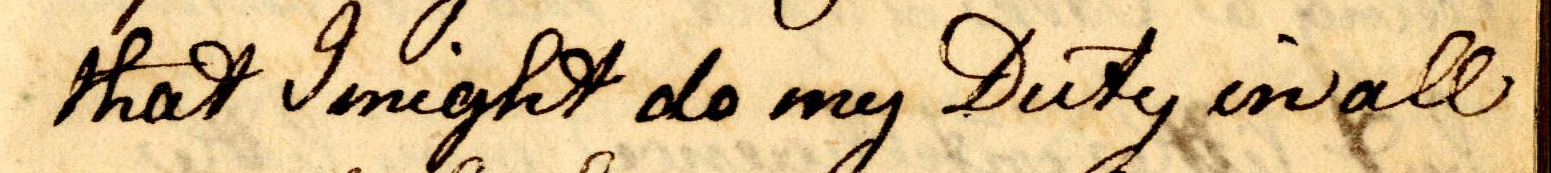that I might do my Duty in all
